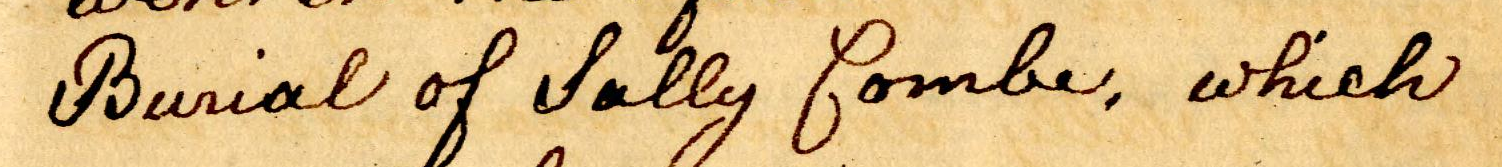Burial of Sally Combe, which
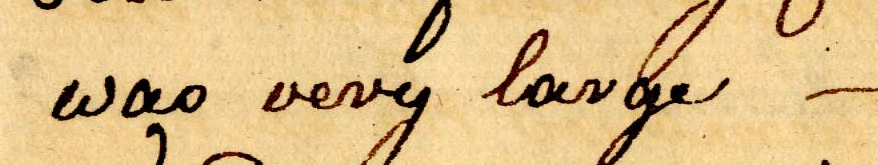was very large-
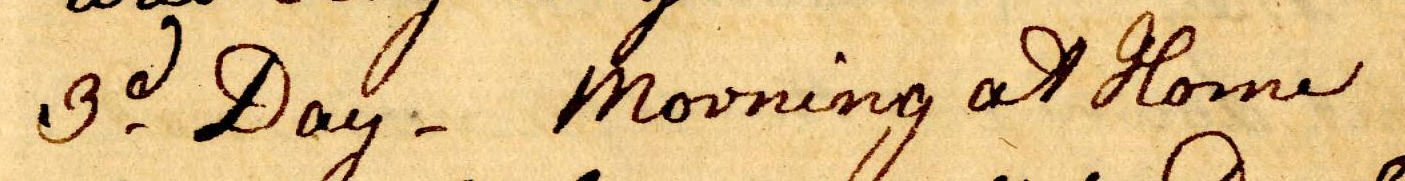3^d. Day- Morning at Home
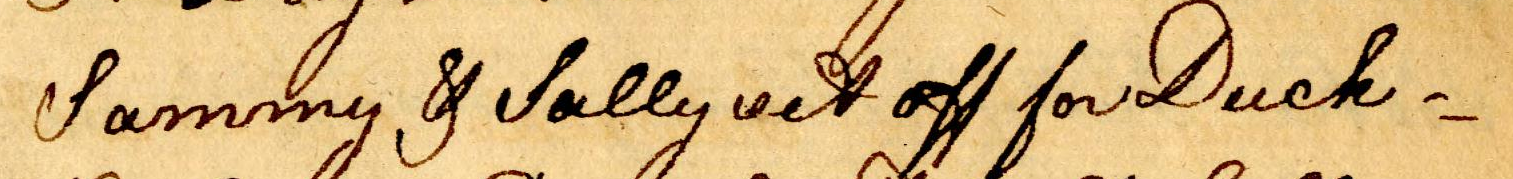Sammy & Sally set off for Duck-
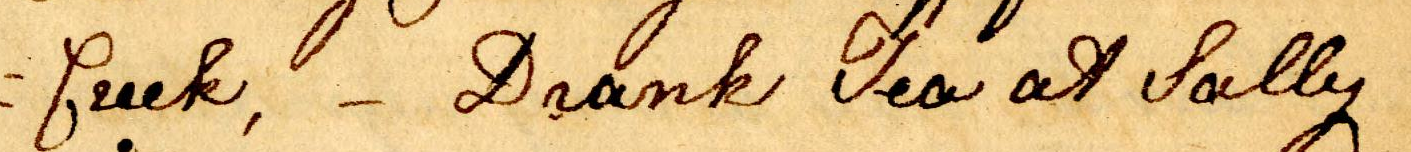-Creek, - Drank Tea at Sally
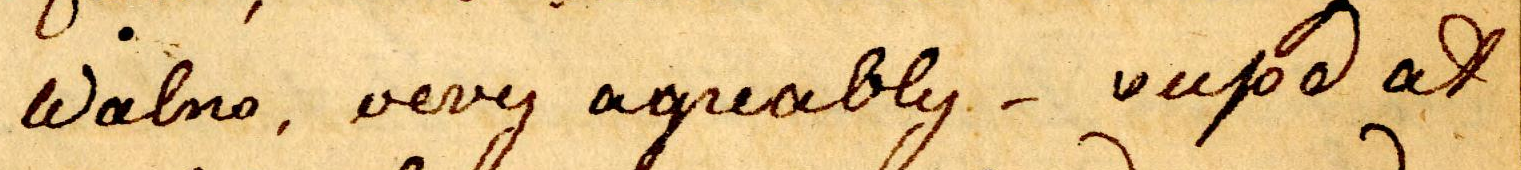Walns, very agreably- supd at
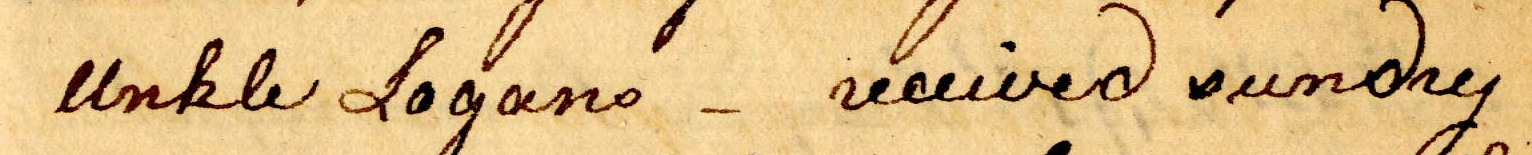Unkle Logans received sundry
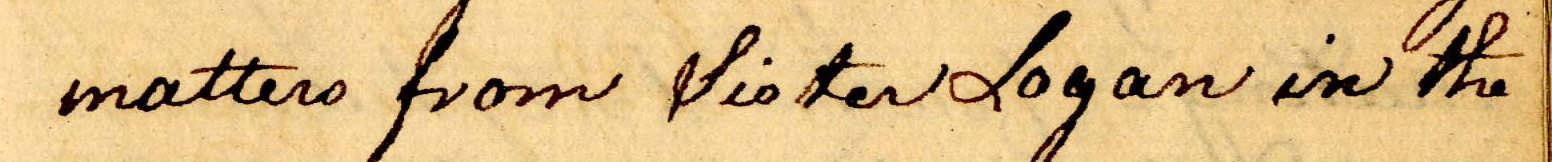matters from Sister Logan in the
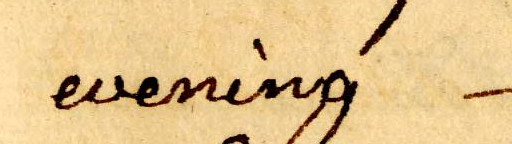evening-
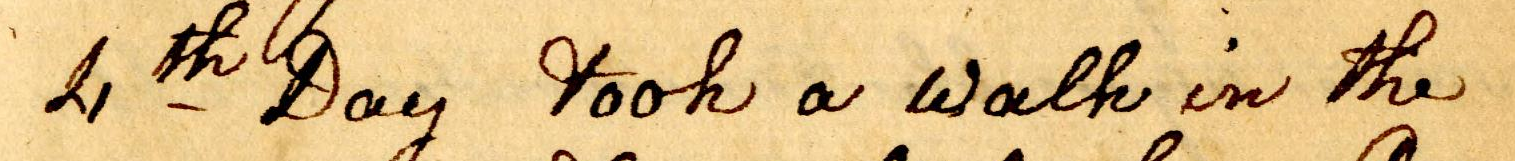4^th Day took a walk in the
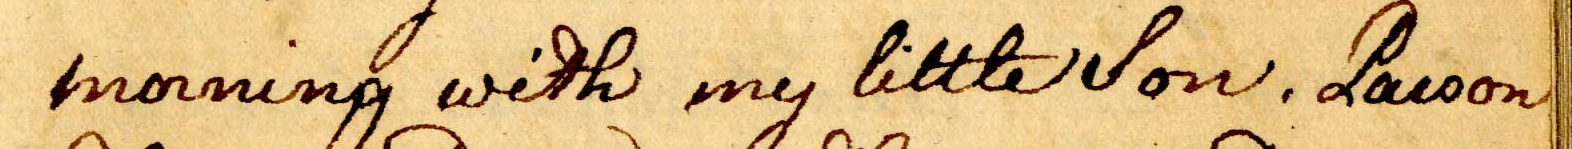morning with my little Son. Parson
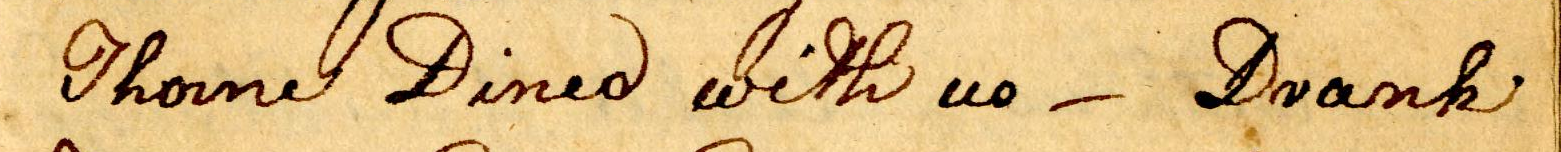Thorne Dined with us- Drank
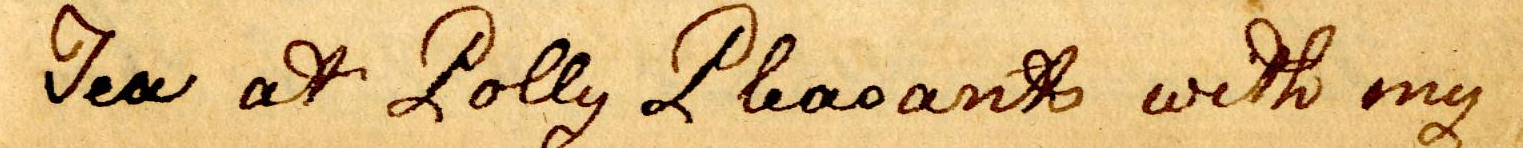Tea at Polly Pleasants with my
